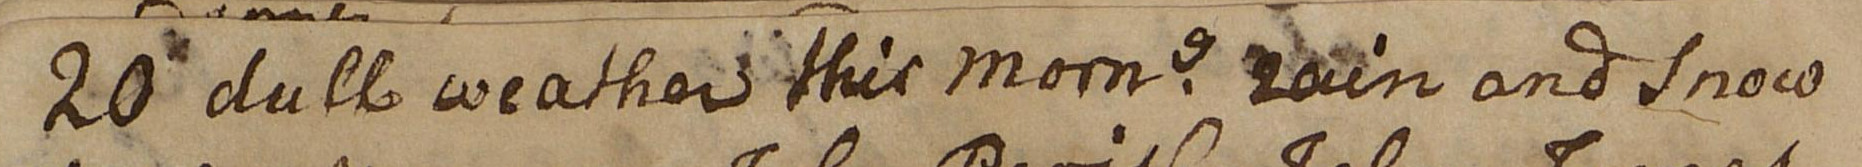20 dull weather this morn^g. rain and Snow
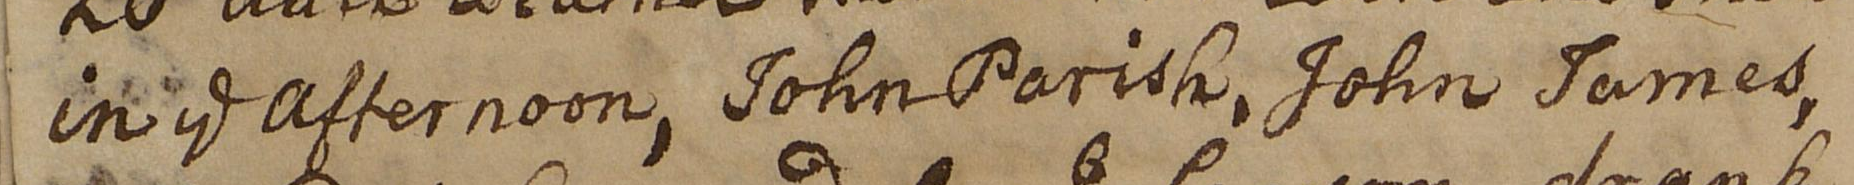in y^e Afternoon, John Parish, John James
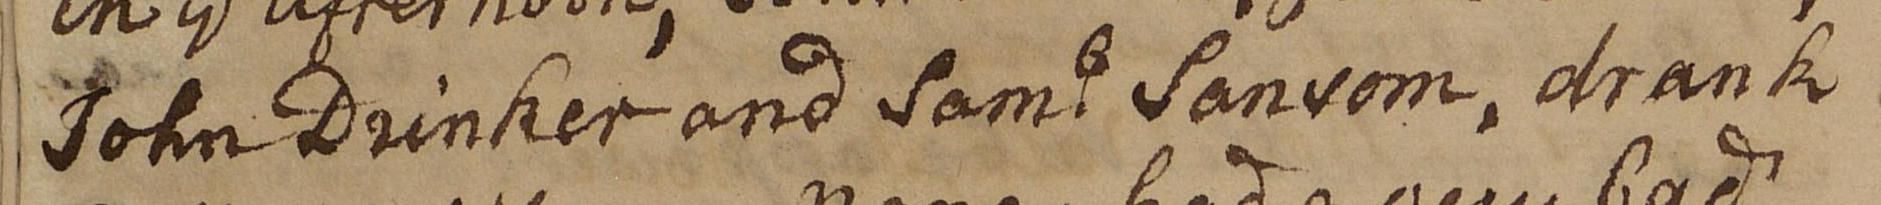John Drinker and Sam^l. Sansom, drank
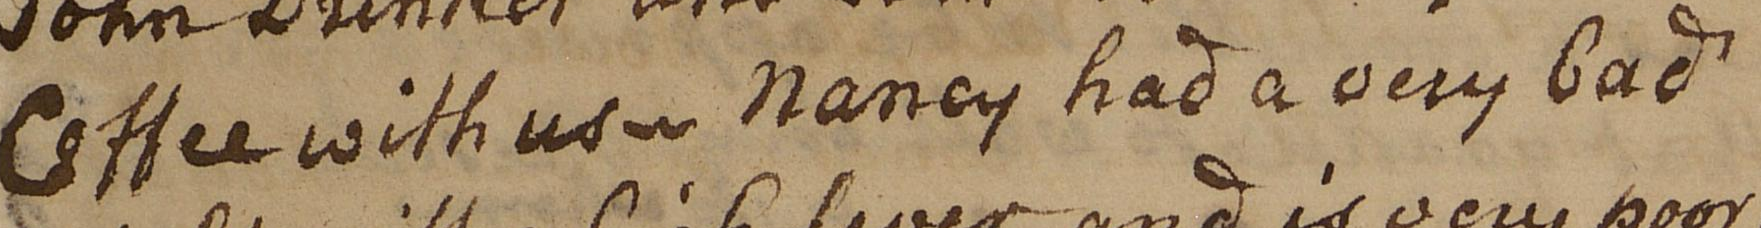Coffee with us- Nancy had a very bad
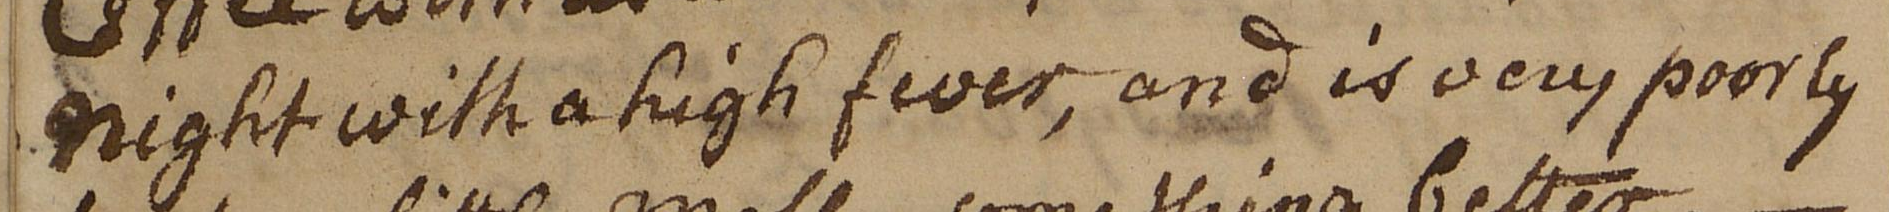Night with a high fever, and is very poorly
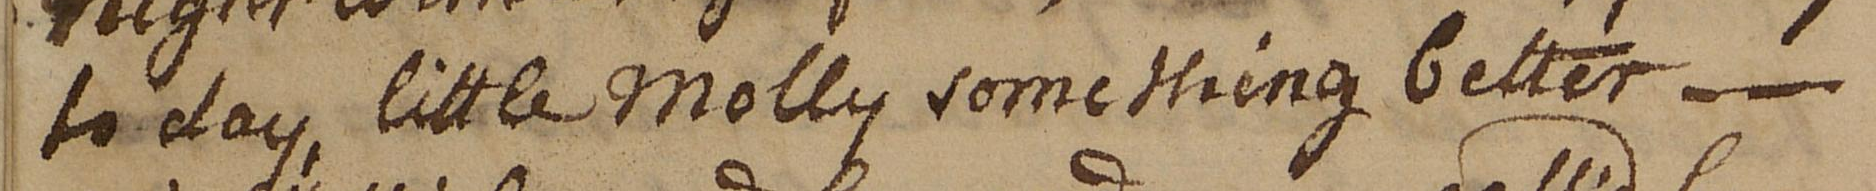to day, little Molly something better-
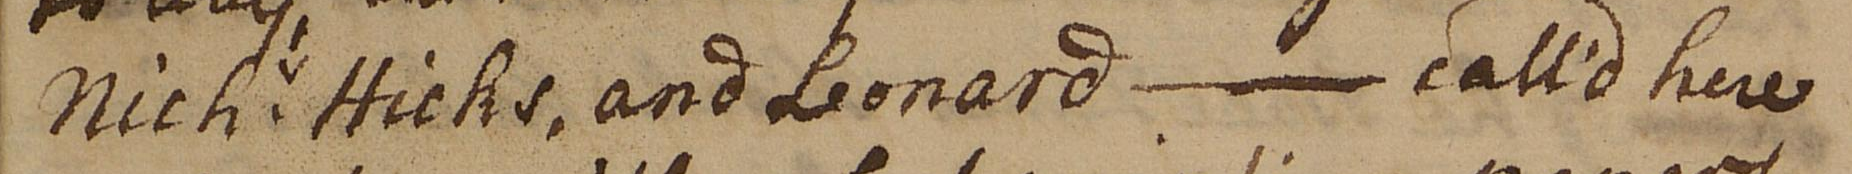Nich^s. Hicks, and Leonard- call'd here
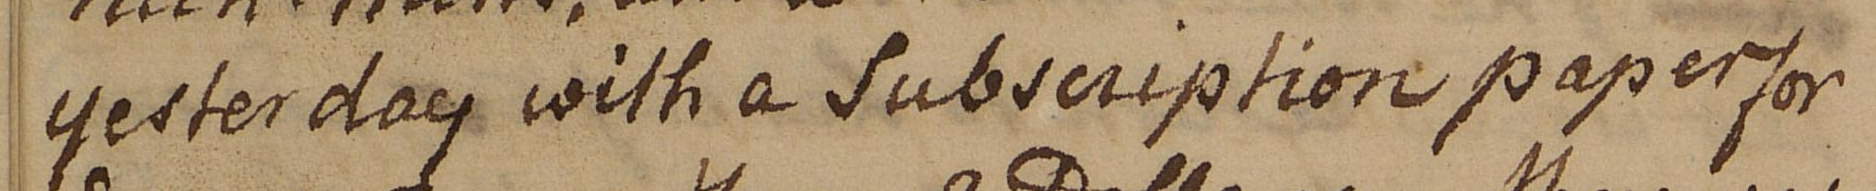yesterday with a Subscription paper for
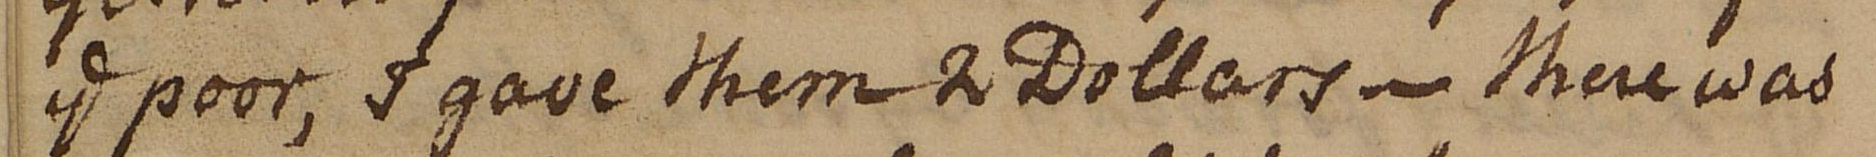y^e poor, I gave them 2 Dollars- there was
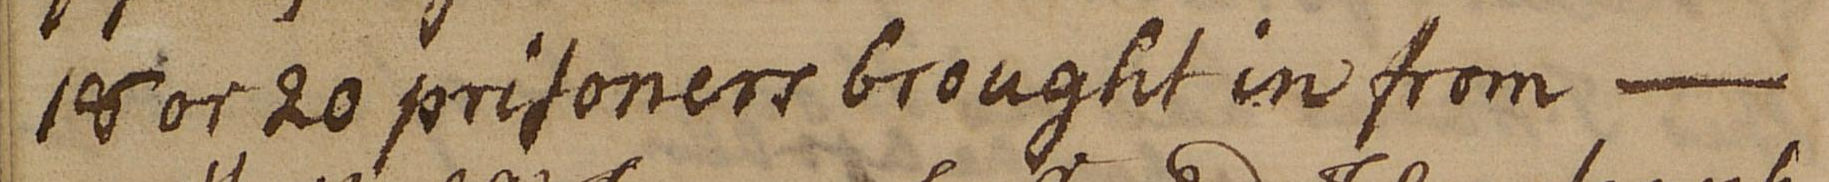18 or 20 prisoners brought in from-
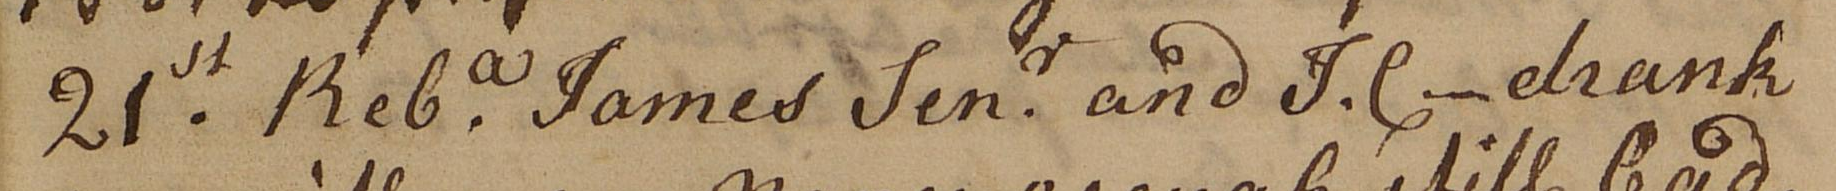21^st. Reb^a. James Sen^r. and J.C- drank
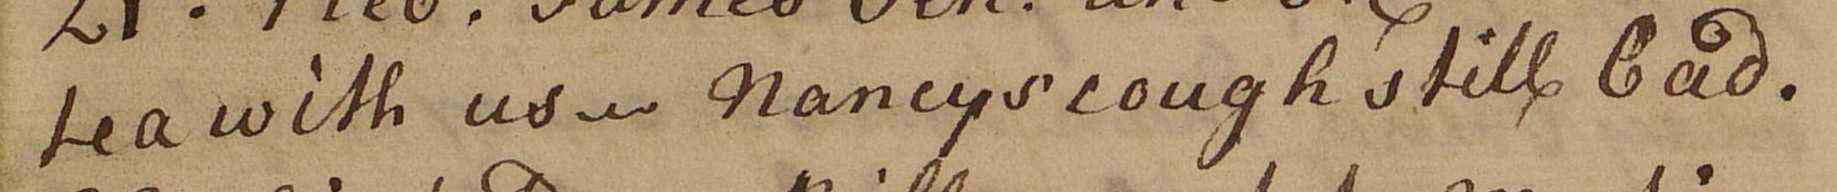tea with us- Nancys cough still bad.
